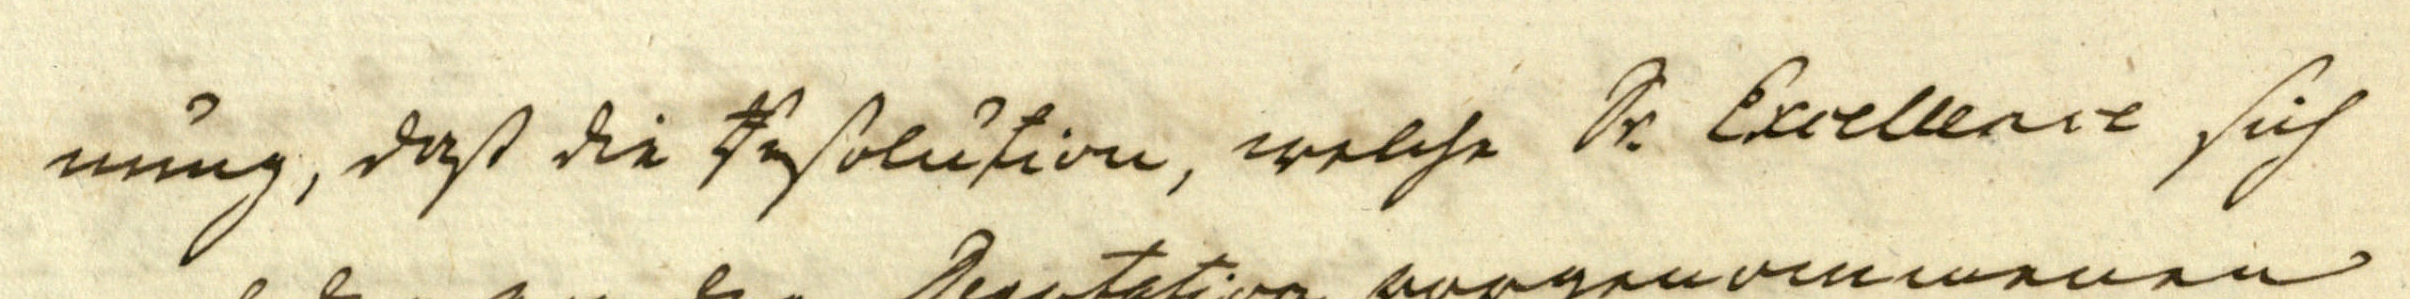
nung, daß die Resolution, welche Sr Excellence sich
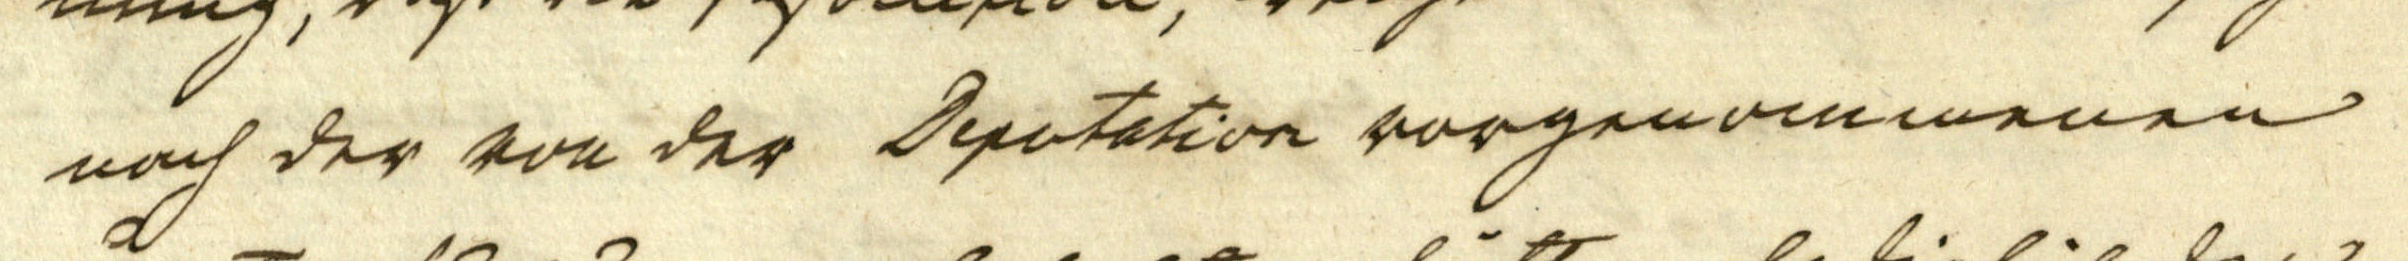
nach der von der Deputation vorgenommenen
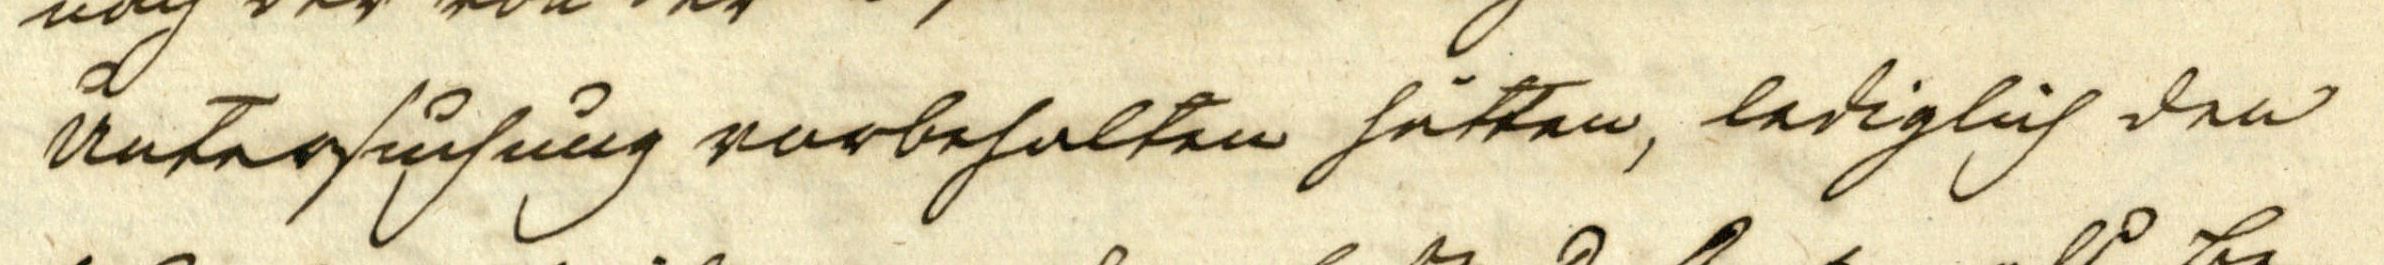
Untersuchung vorbehalten hätten, lediglich den
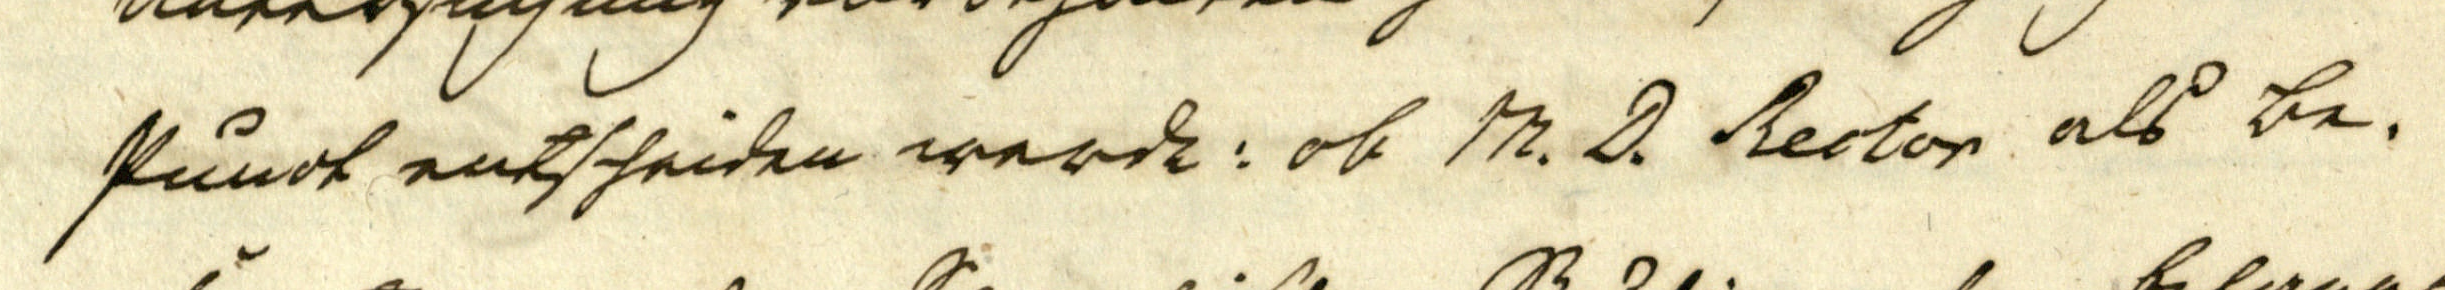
Punct entscheiden werde: ob M. D. Rector als be¬
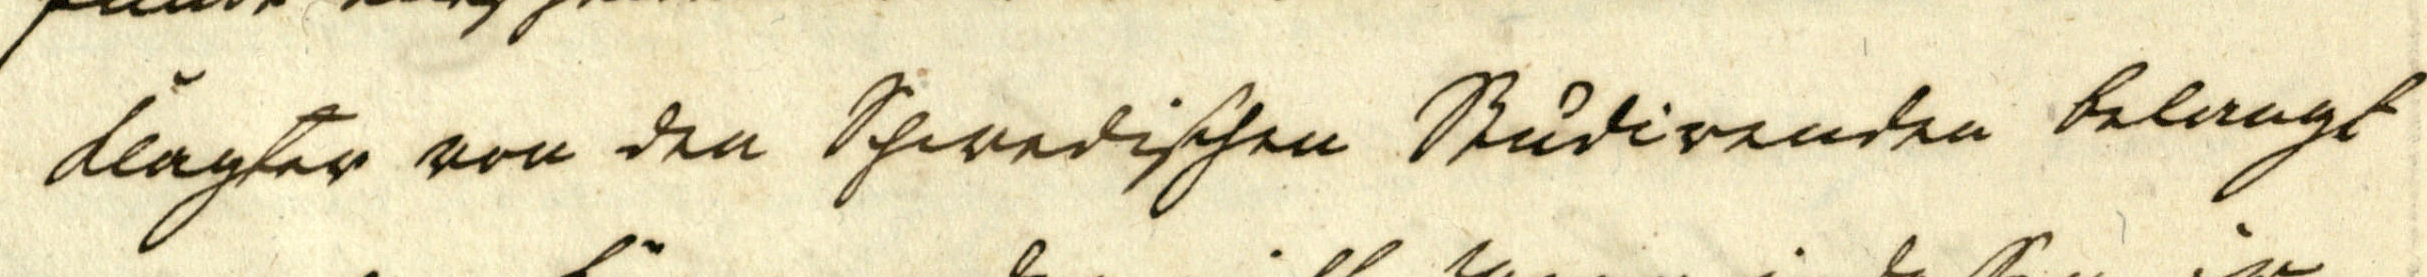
klagter von den Schwedischen Studirenden belangt
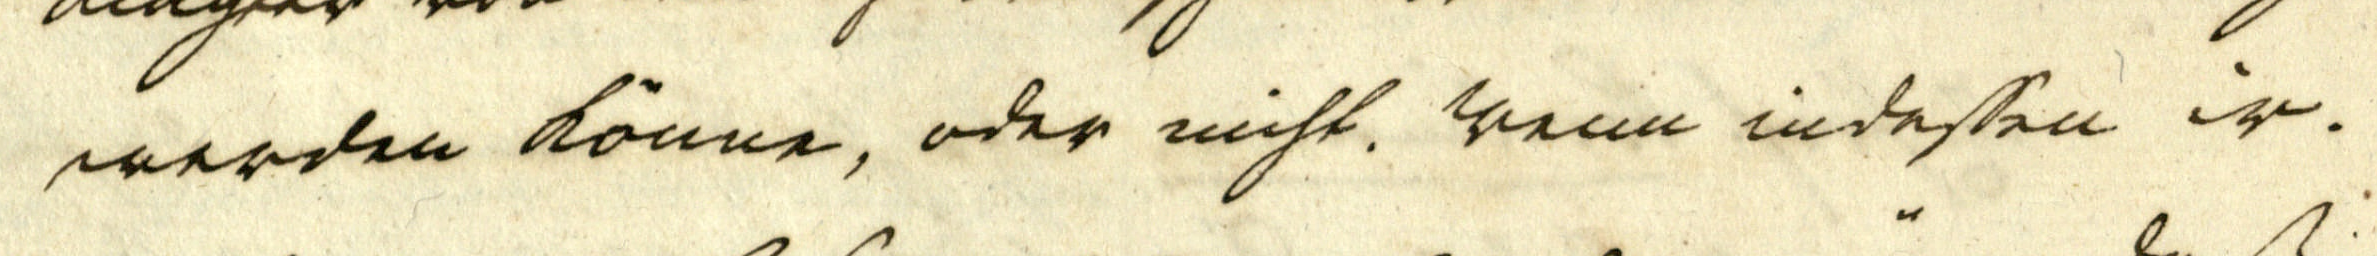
werden könne, oder nicht. Wenn indessen ir¬
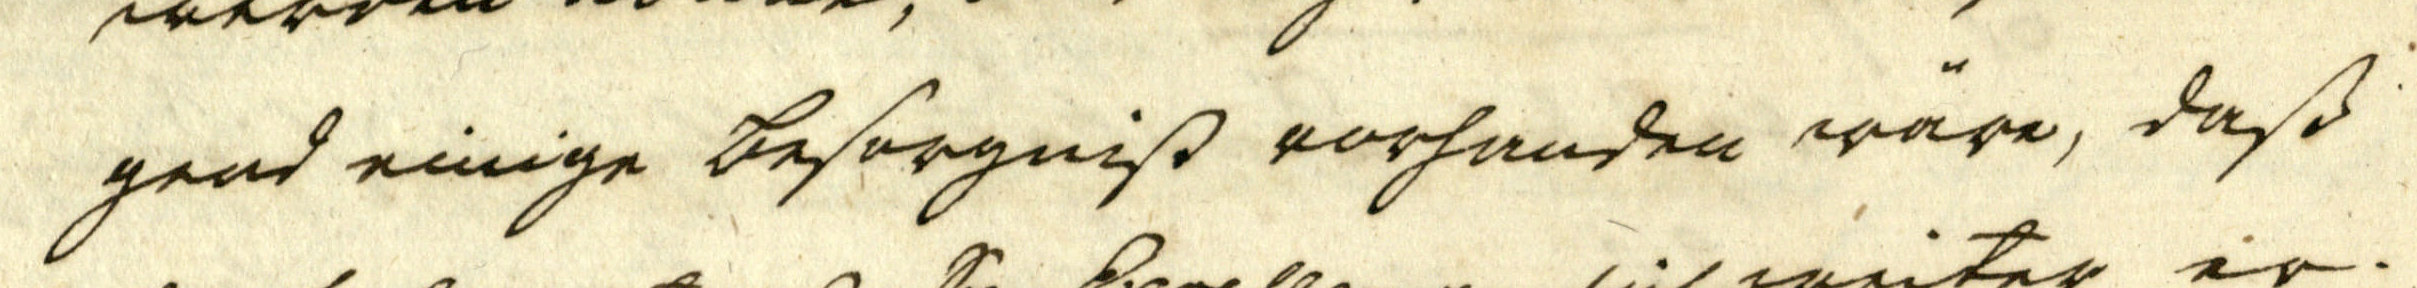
gend einige Besorgniß vorhanden wäre, daß
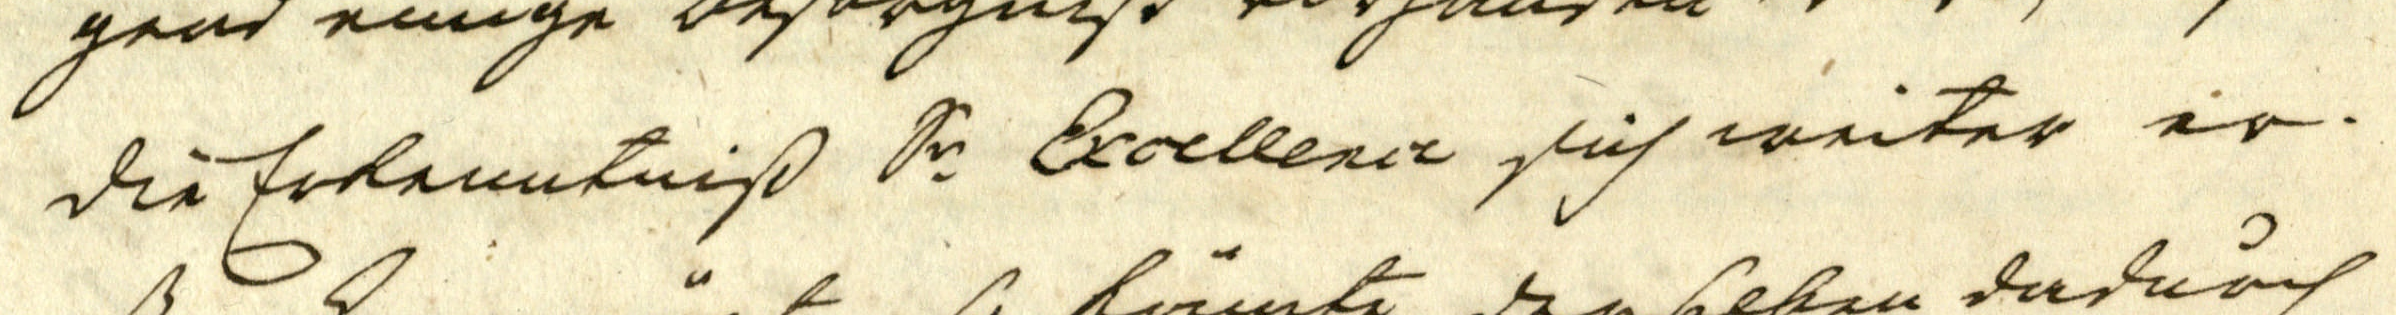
die Erkenntniß Sr Excellence sich weiter er¬
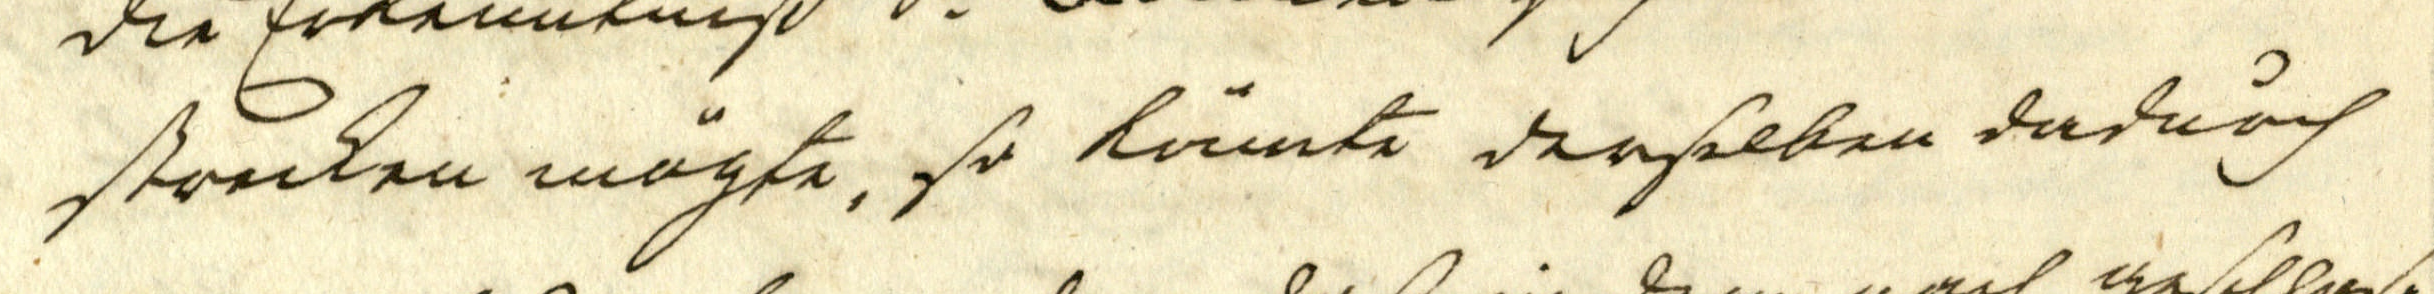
strecken mögte, so könnte derselben dadurch
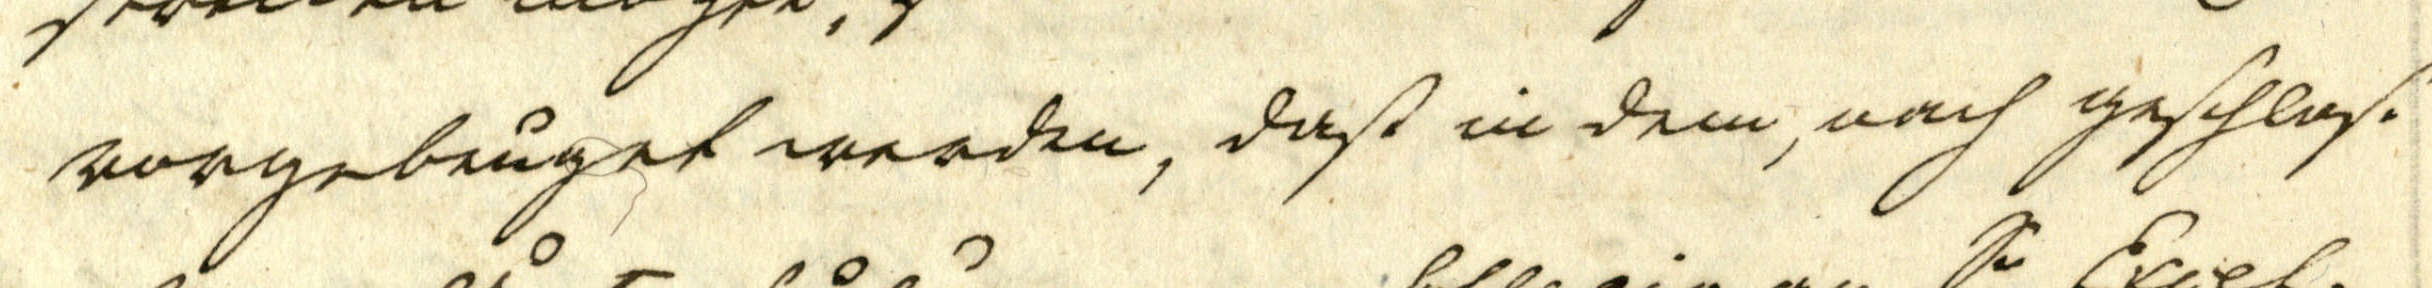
vorgebeuget werden, daß in dem, nach geschlos¬
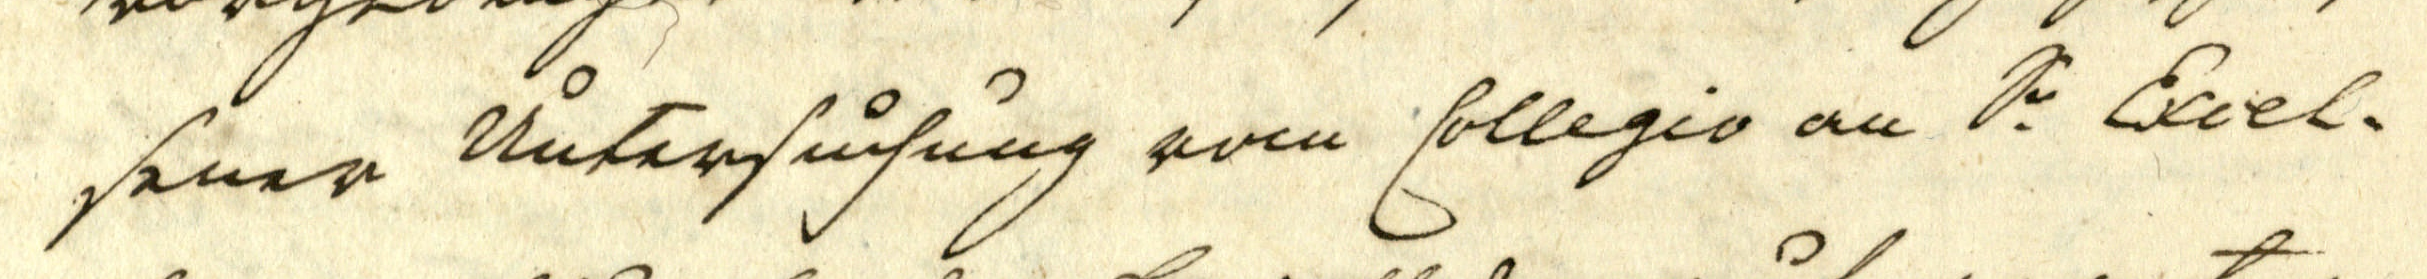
sener Untersuchung vom Collegio an Sr Excel¬
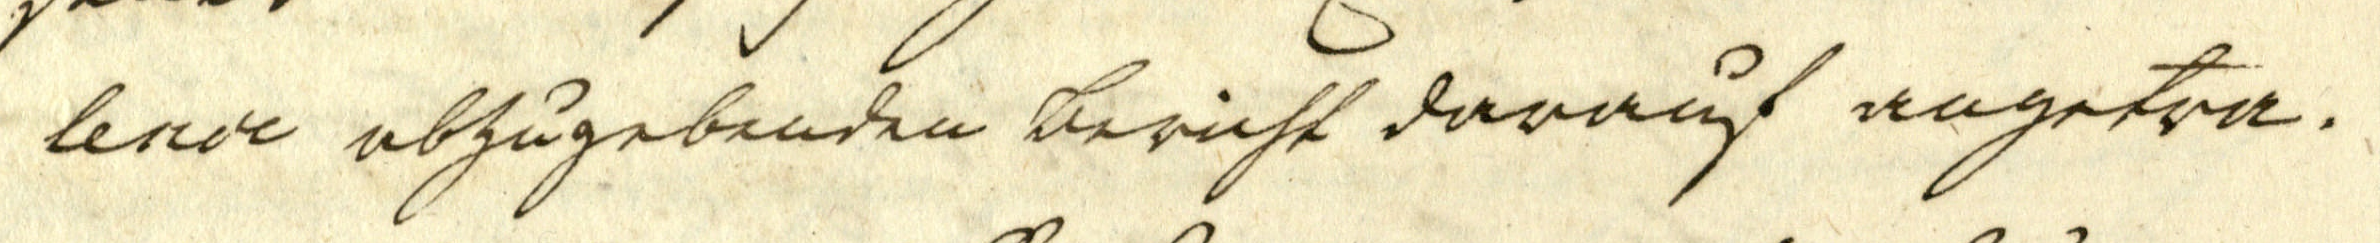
lence abzugebenden Bericht darauf angetra¬
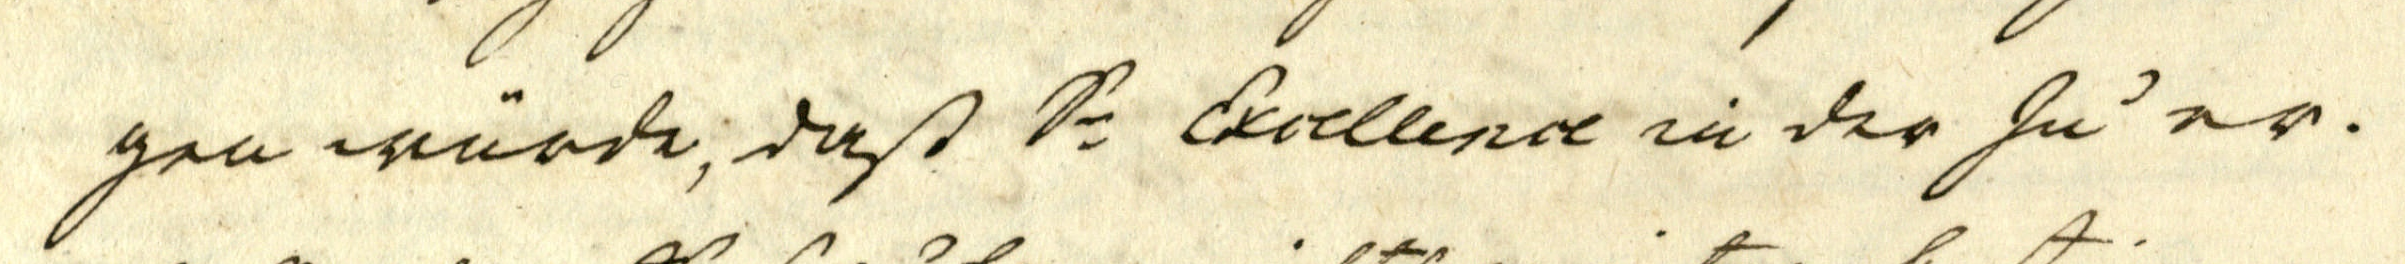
gen würde, daß Sr Excellence in der zu er¬
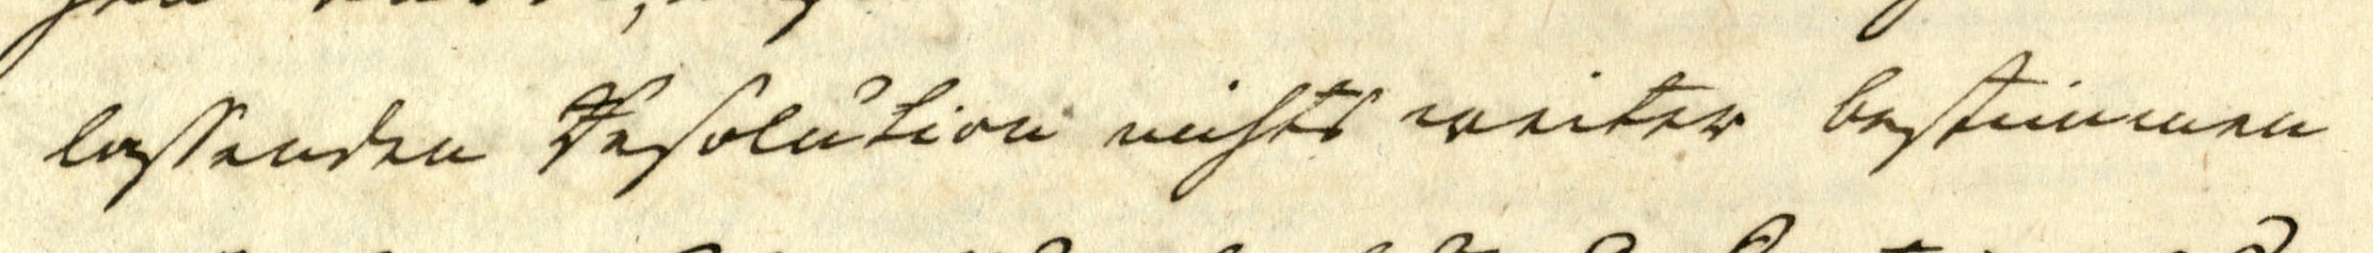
lassenden Resolution nichts weiter bestimmen
